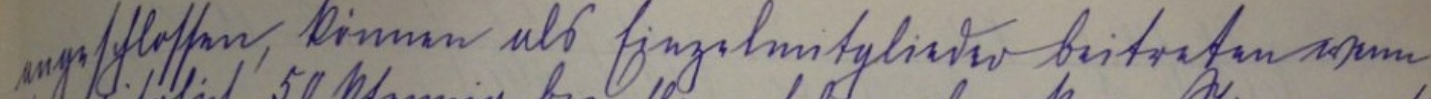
angeschlossen können als Einzelmitglieder beitreten, wenn
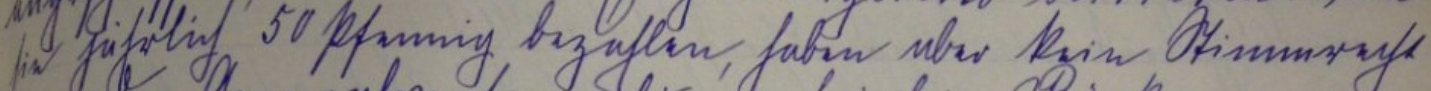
sie jeweils 50 Pfennig bezahlen, haben aber kein Stimmrecht
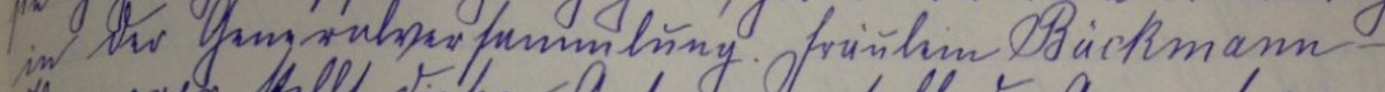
in der Generalversammlung. Fräulein Buckmann
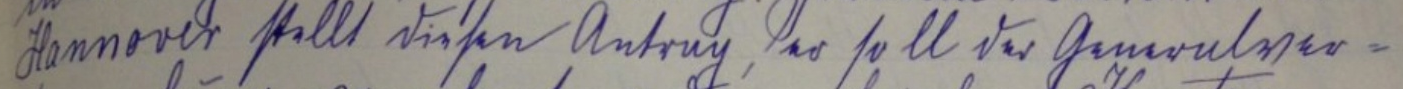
Hannover stellt diesen Antrag, er soll der Generalver
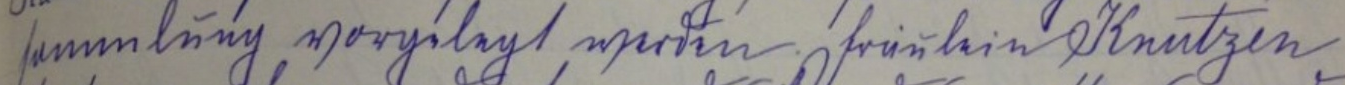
sammlung vorgelegt werden. Fräulein Knutzen
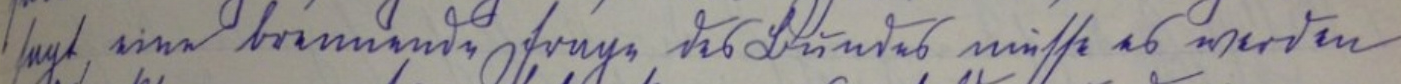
sagt eine brennende Frage des Bundes müsse es werden
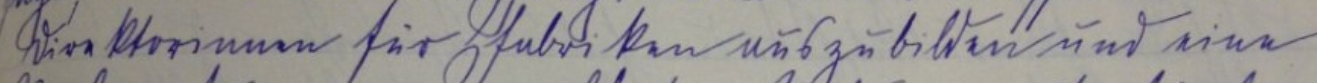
Direktorinnen für Fabriken auszubilden und eine
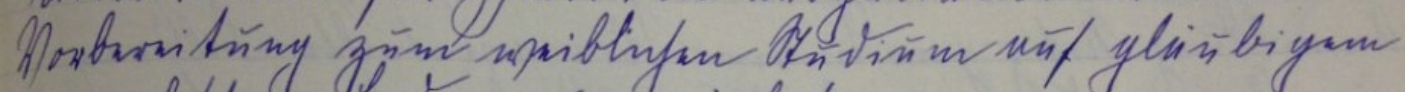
Vorbereitung zum weiblichen Studium auf gläubigem
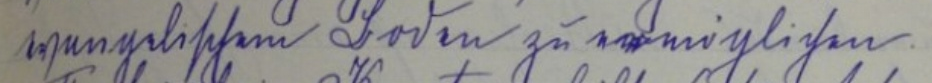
evangelischem Boden zu ermöglichen.
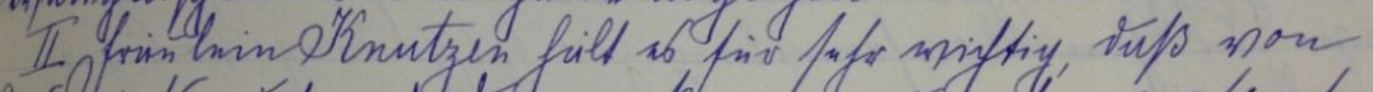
II. Fräulein Knutzen hält es für sehr wichtig, daß von
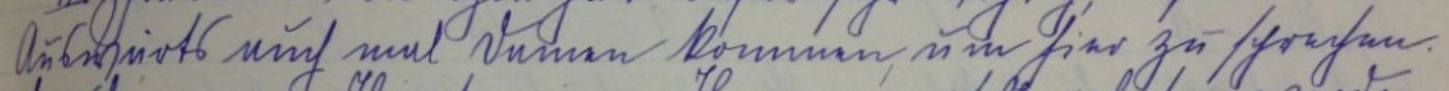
Auswärts auch mal Damen kommen um hier zu sprechen.
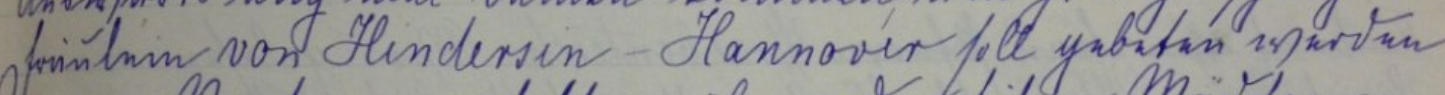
Fräulein von Hindersen – Hannover soll gebeten werden
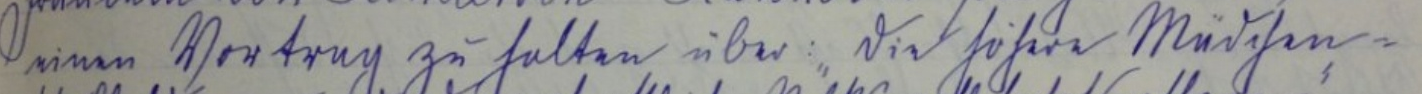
einen Vortrag zu halten über „Die höhere Mädchen-
